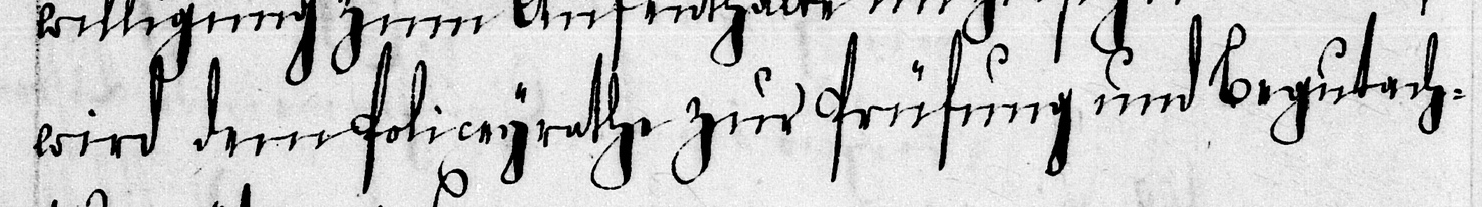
wird dem Policeyrathe zur Prüfung und Begutach¬
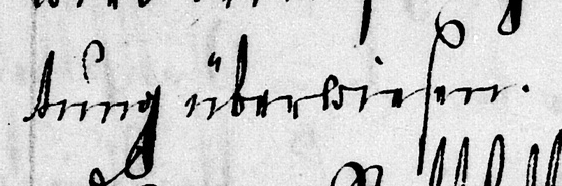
tung überwiesen.
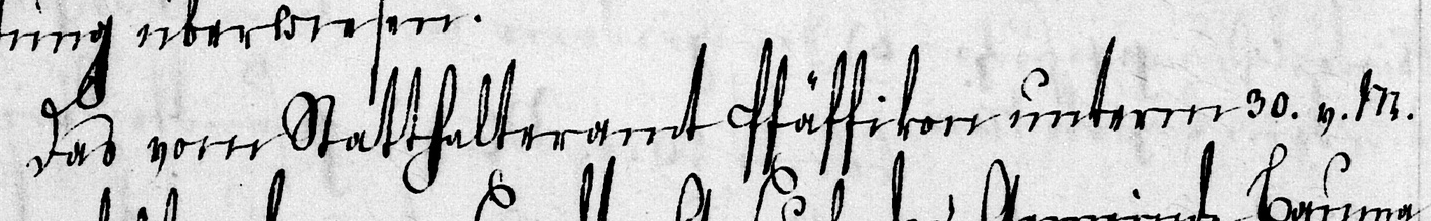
Das vom Statthalteramt Pfäffikon unterm 30. v. M.
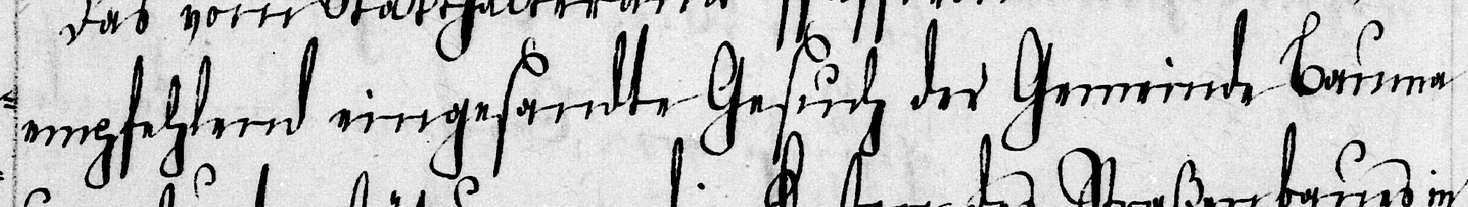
empfehlend eingesandte Gesuch der Gemeinde Bauma
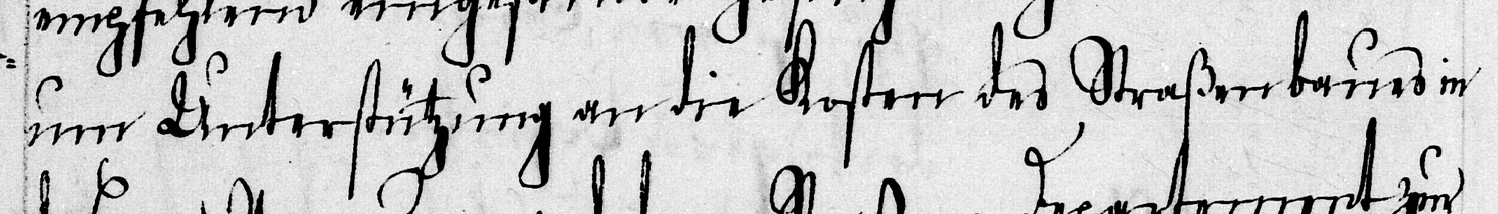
um Unterstützung an die Kosten des Straßenbaues in
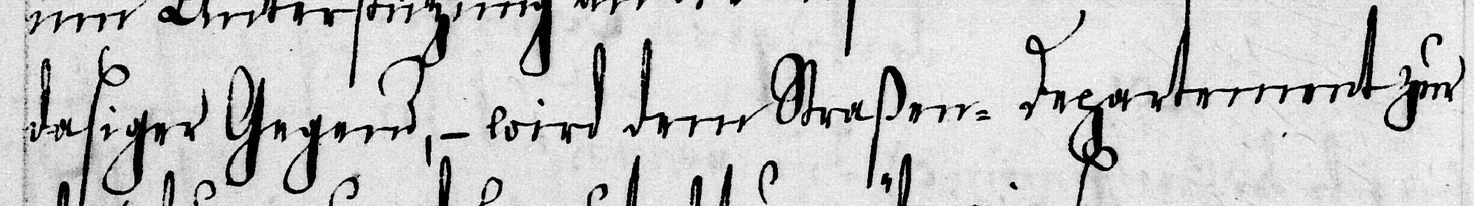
dasiger Gegend, – wird dem Straßen-Departement zur
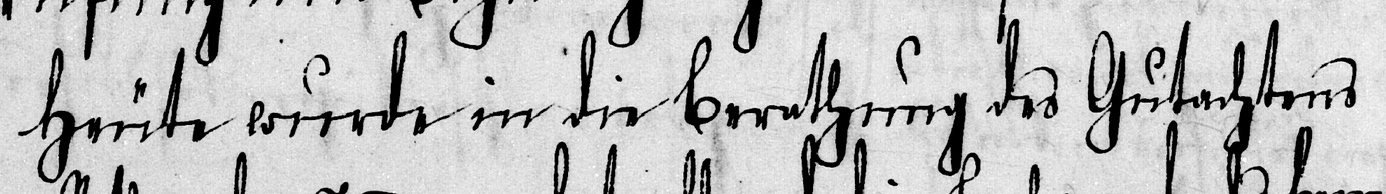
Heute wurde in die Berathung des Gutachtens
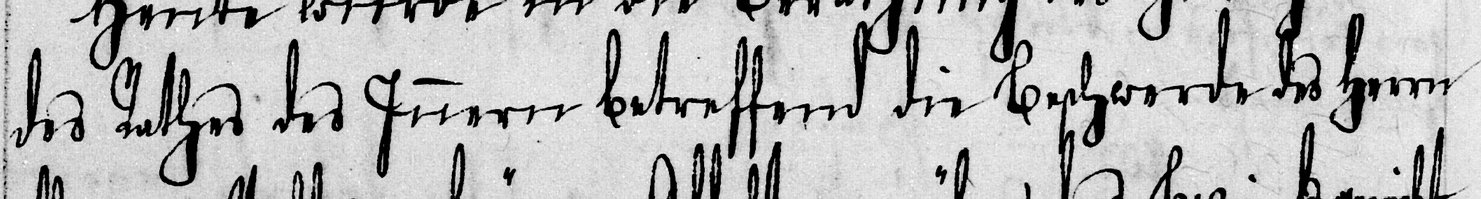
des Rathes des Innern betreffend die Beschwerde des Herrn
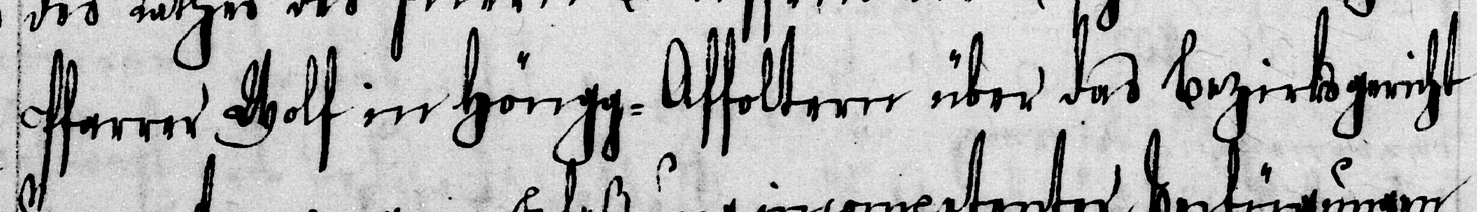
Pfarrer Wolf in Höngg-Affoltern über das Bezirksgeric¬
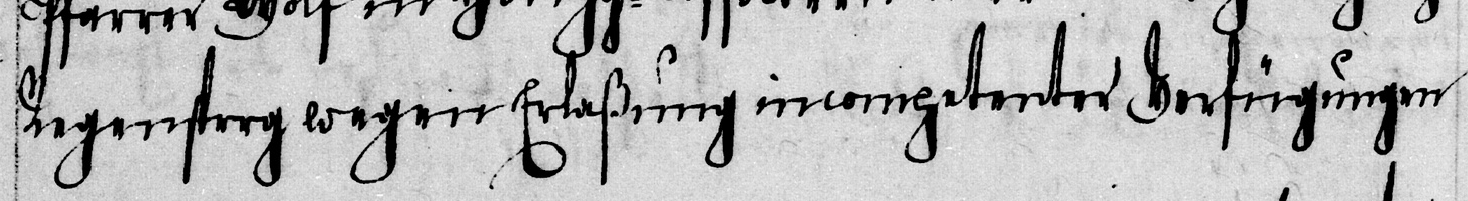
Regensperg wegen Erlaßung incompetenter Verfügungen
